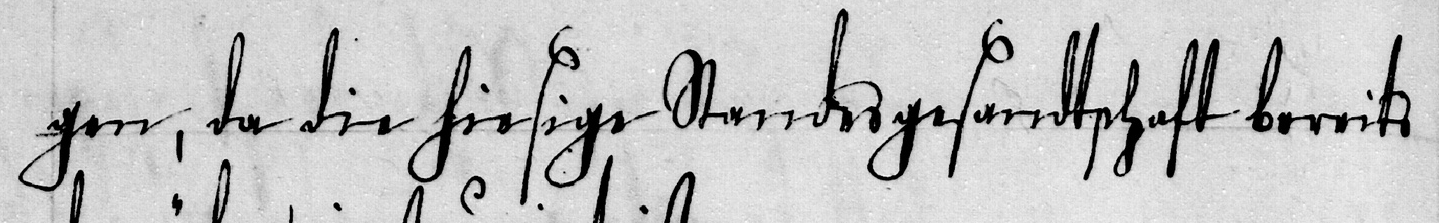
gen, da die hiesige Standesgesandtschaft bereits
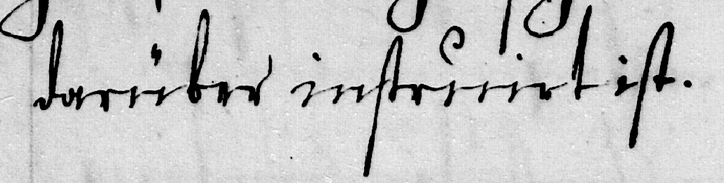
darüber instruirt ist.
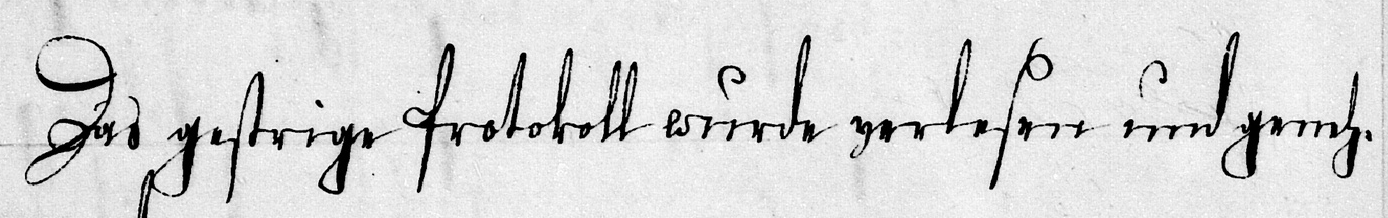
Das gestrige Protokoll wurde verlesen und geneh¬
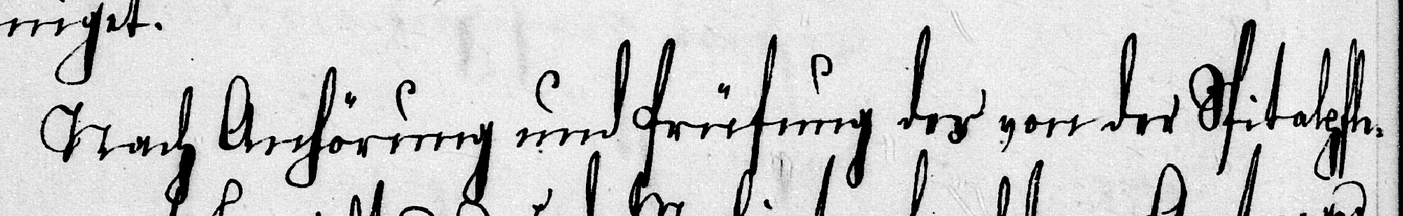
Nach Anhörung und Prüfung des von der Spitalp¬
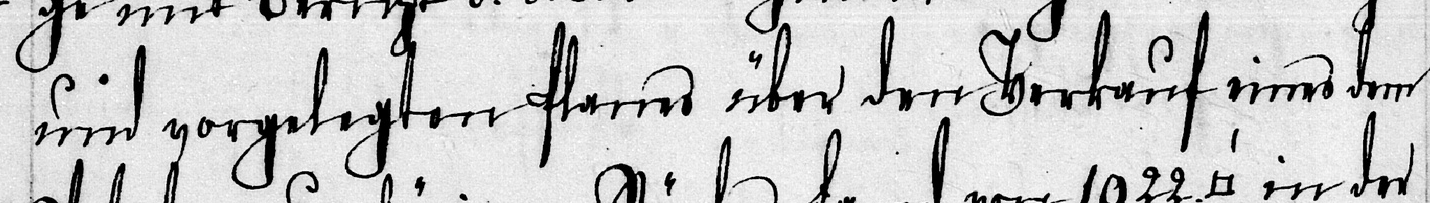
und vorgelegten Planes über den Verkauf eines dem
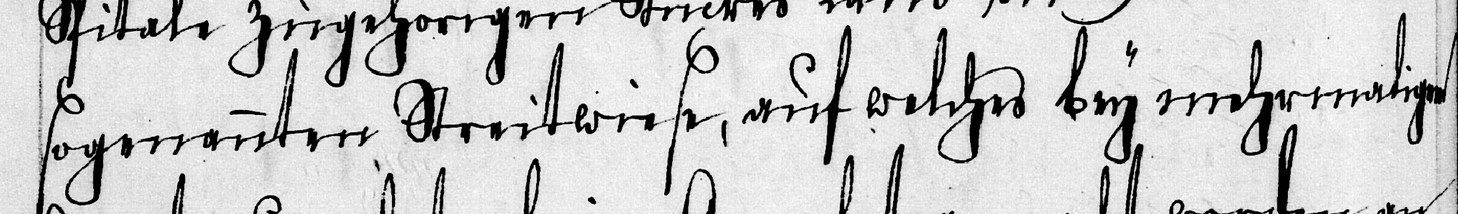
sogenannten Streitwiese, auf welches bey mehrmaligen
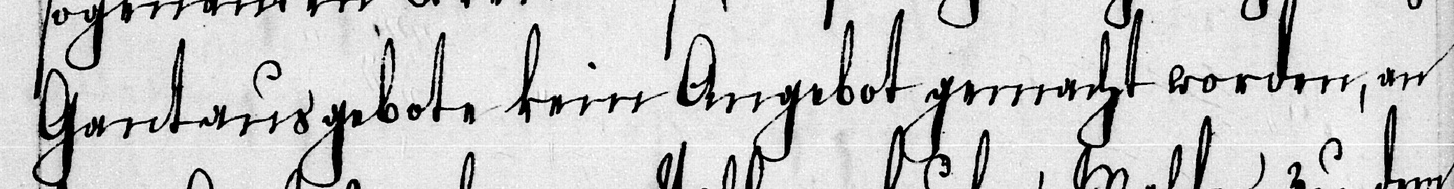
Gantausgebote kein Angebot gemacht worden, an
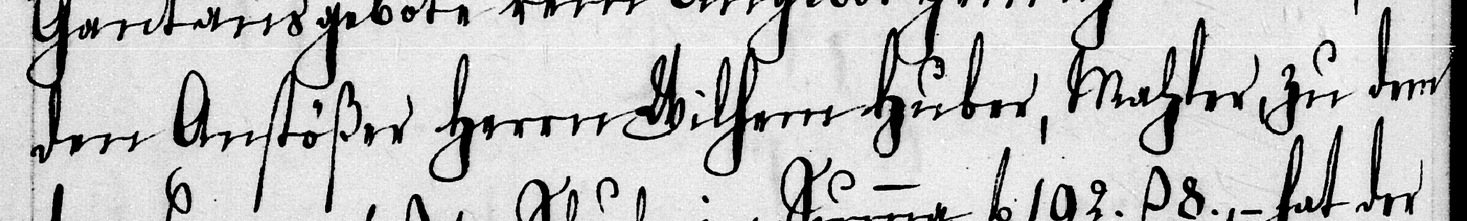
den Anstößer Herrn Wilhem Huber, Mahler, zu dem
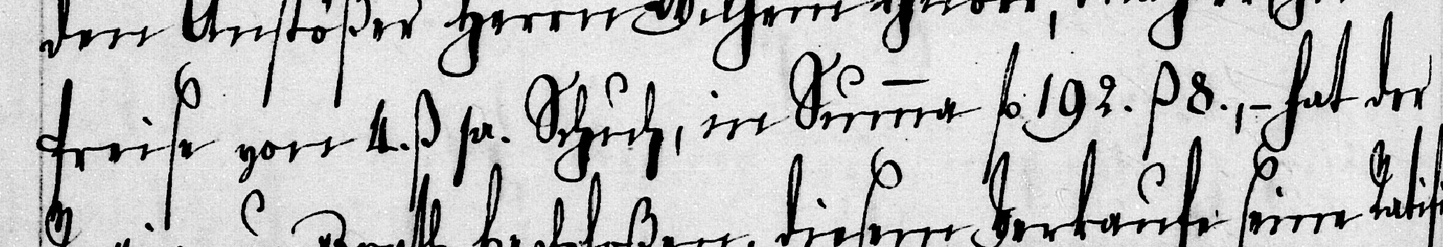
Preise von 4. ß p. Schuh, in Summa fl. 192. ß 8., – hat der
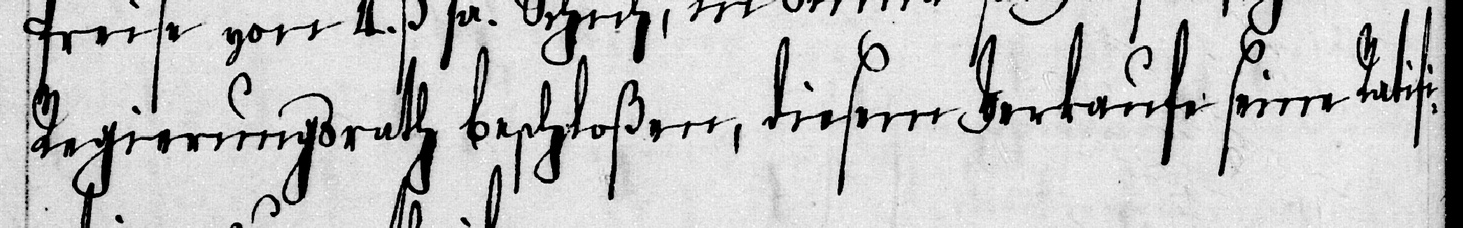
Regierungsrath beschloßen, diesem Verkaufe seine Ra¬
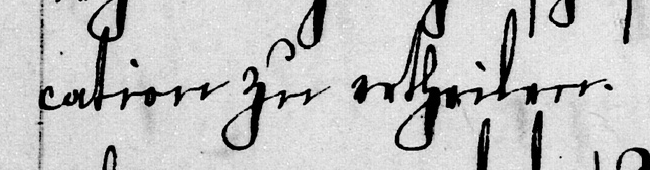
cation zu ertheilen.
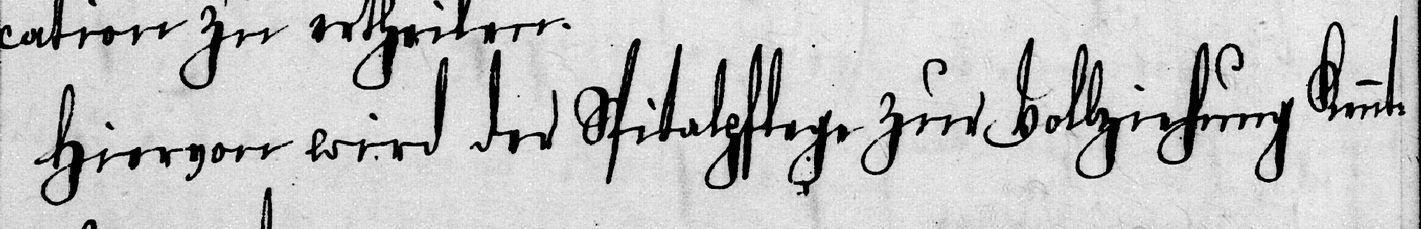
Hiervon wird der Spitalpflege zur Vollziehung Ken¬
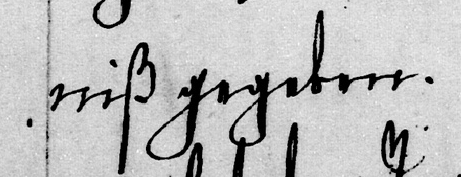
ntniß gegeben.
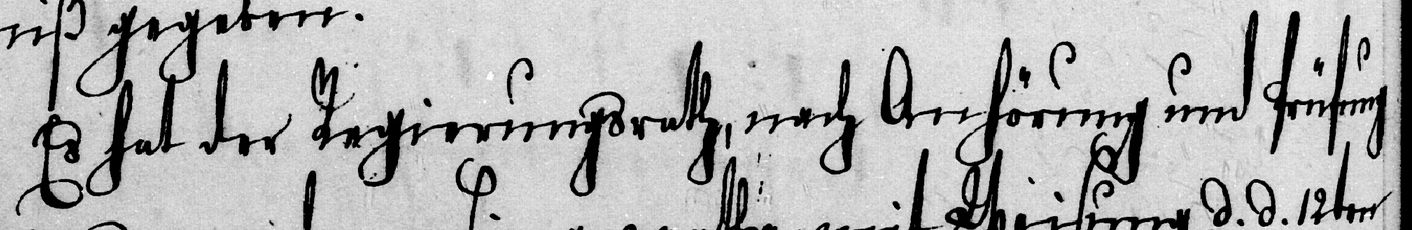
Es hat der Regierungsrath, nach Anhörung und Prüfu¬
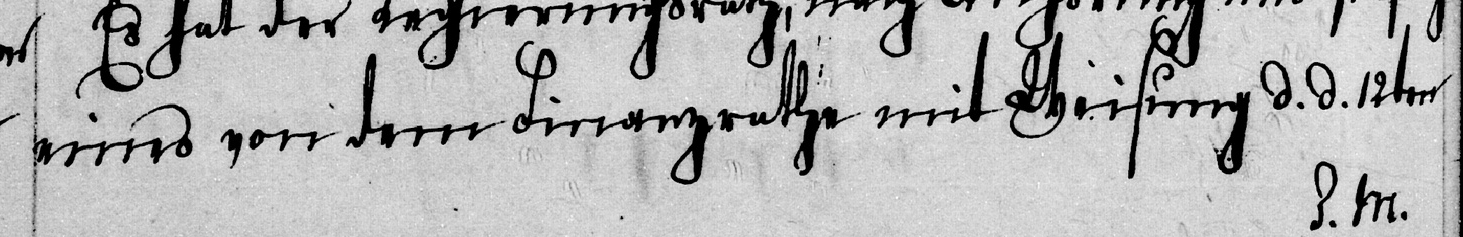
eines von dem Finanzrathe mit Weisung d. d. 12ten
